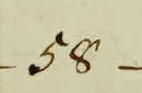58
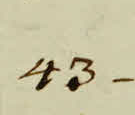43
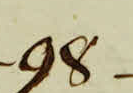98
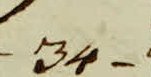34
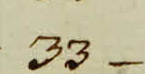33
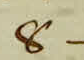8
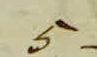5
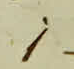1
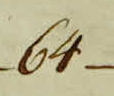64
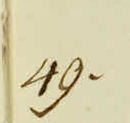49.
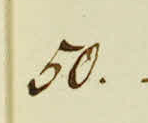50.
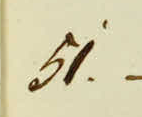51.
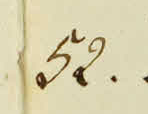52.
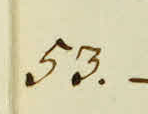53.
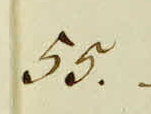55.
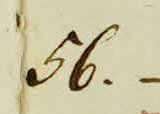56.
